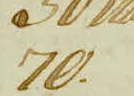70.
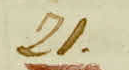21.
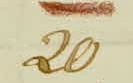23
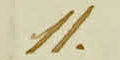11.
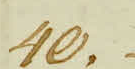40.
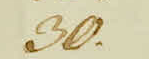30.
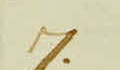7.
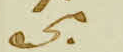5.
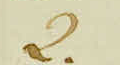2.
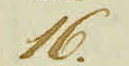16.
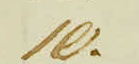10.
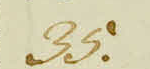35.
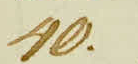40.
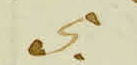5.
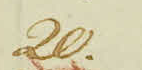20.
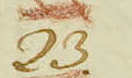23.
